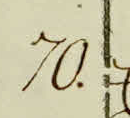70.
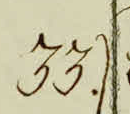33.
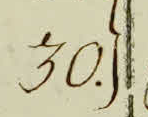30.
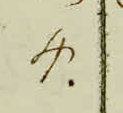4.
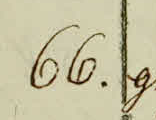66.
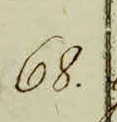68.
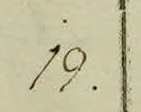19.
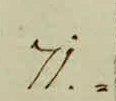71.
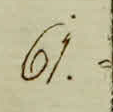61.
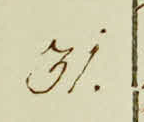31.
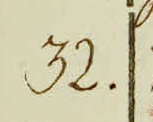32.
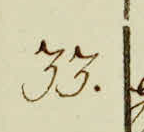33.
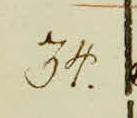34.
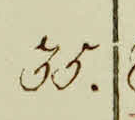35.
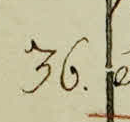36.
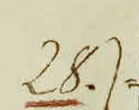28.
